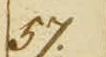57.
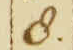8.
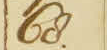68.
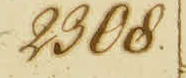2308.
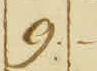9.
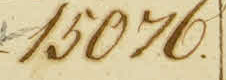15076.
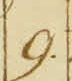9.
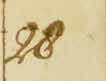28.
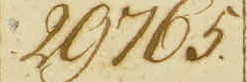29765.
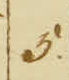5.
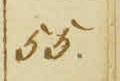55.
